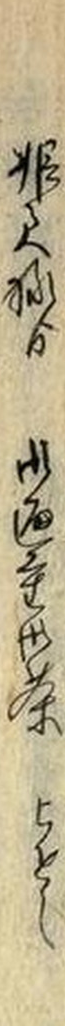姫君様ゟ御返書御茶被進之
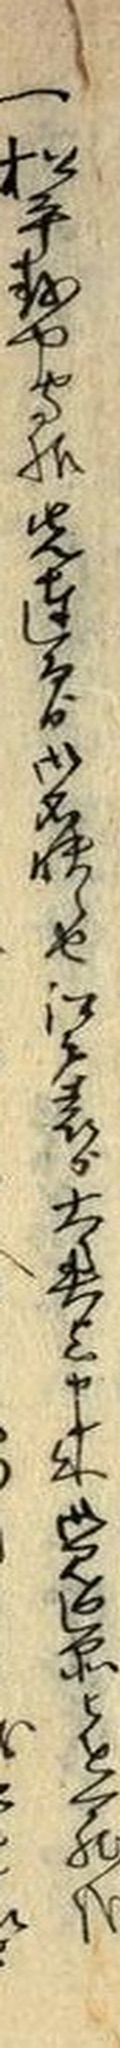一松平越中守様先達而ゟ御不快候由江戸表ゟ大奥迄申来御見廻品被進可然哉
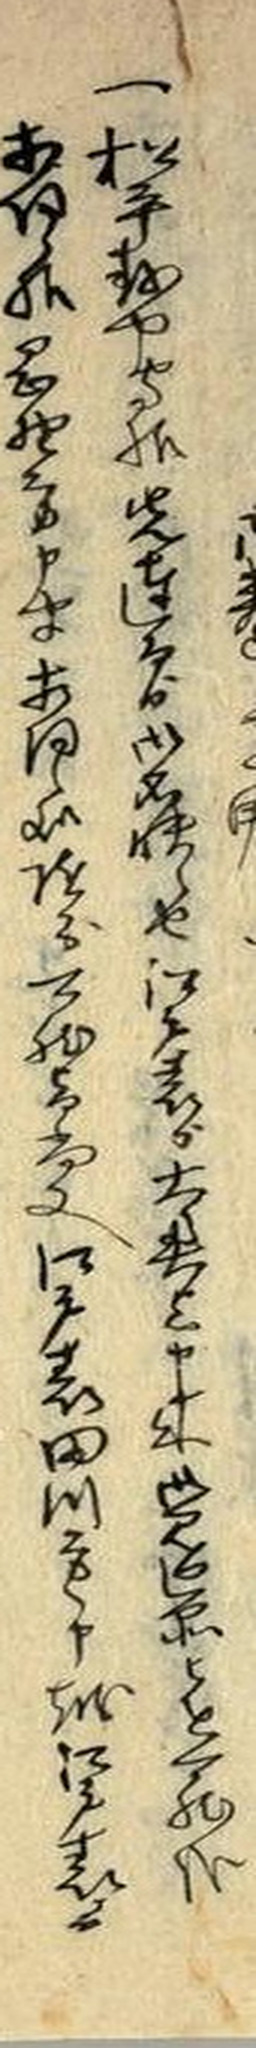相伺候様岡野方申聞相伺候処随分可然旨尚又江戸表田川方へ申越江戸表ニ而
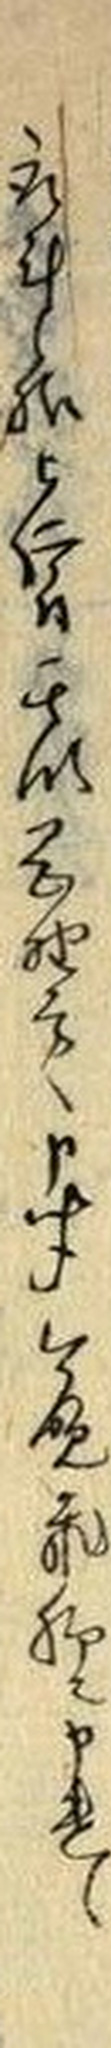取斗候様被仰付其段岡野方へ申聞今晩飛脚ニ申遣候
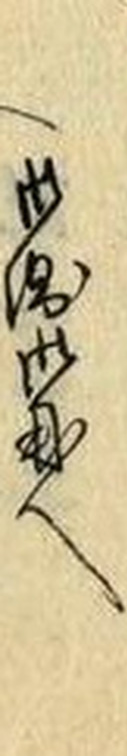御側御用人
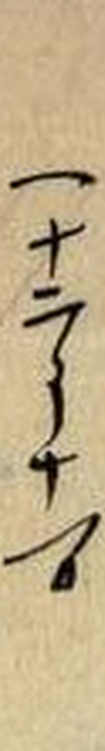一十二月十一日
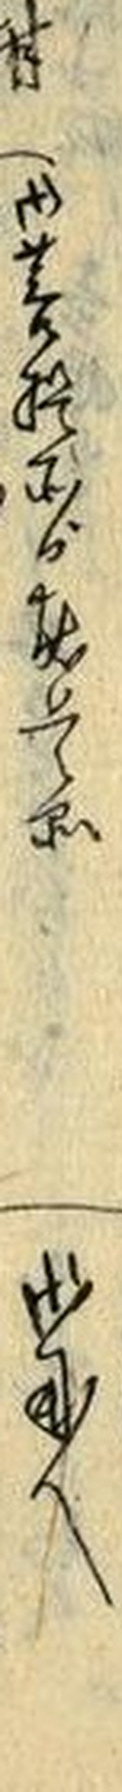蜜柑御菩提所ゟ献上之品御用人
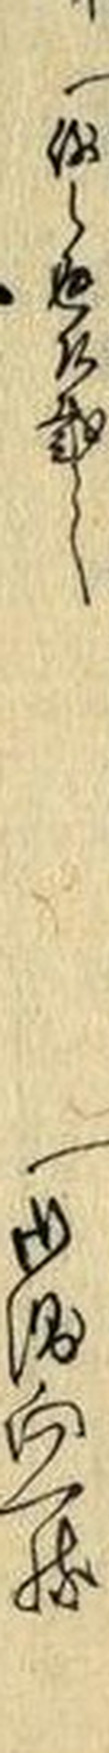例之通頂戴之御側向一統
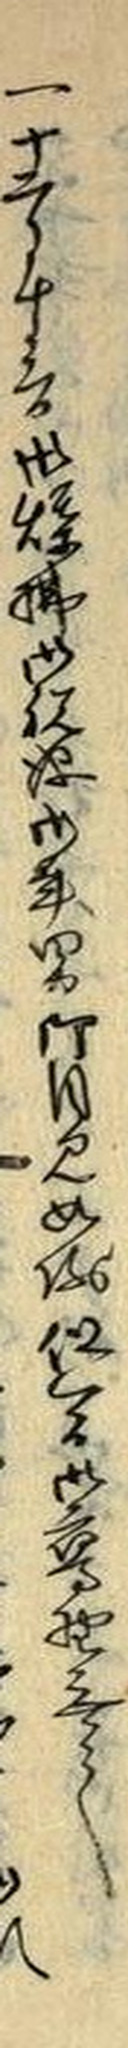一十二月十三日御煤払御祝儀御年男御目見如例但今日御鷹野無之
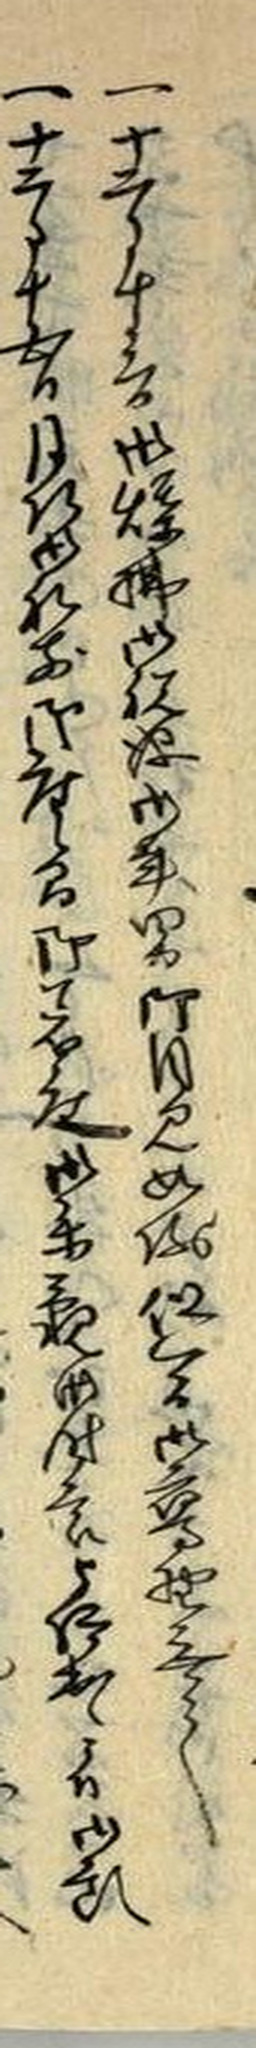一十二月十五日月次御礼於御座之間御着座御参観御時節被仰出候ニ付御歓
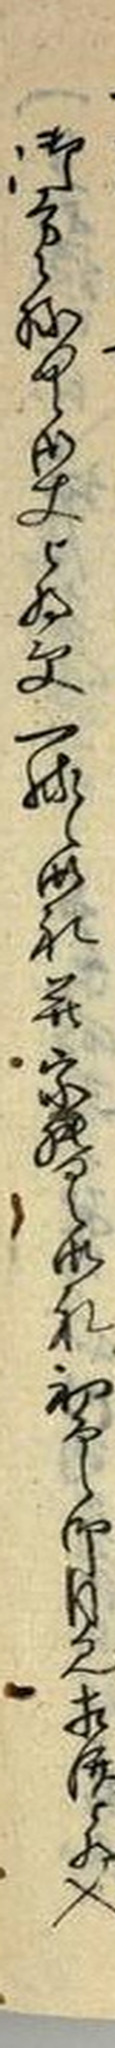御方々様ゟ之御使被為受一統御礼并家督之御礼初而之御目見相済被為入
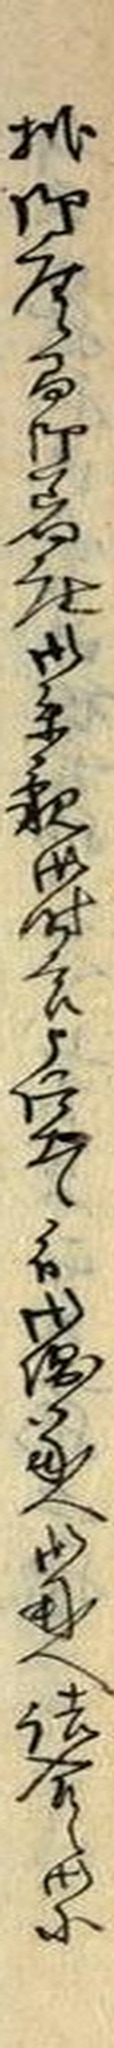掛御座之間御着座御参観御時節被仰出候ニ付御側御用人御用人詰合御小
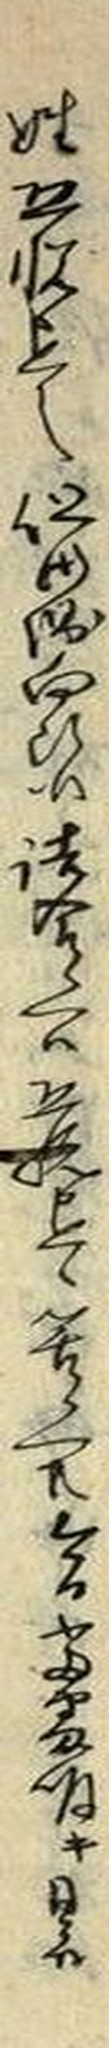姓恐悦申上之但御側向頭取詰合候へハ恐悦申上候筈ニ候へ共今日当番明キ日ニ付
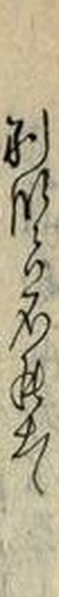別段ニハ不罷出候
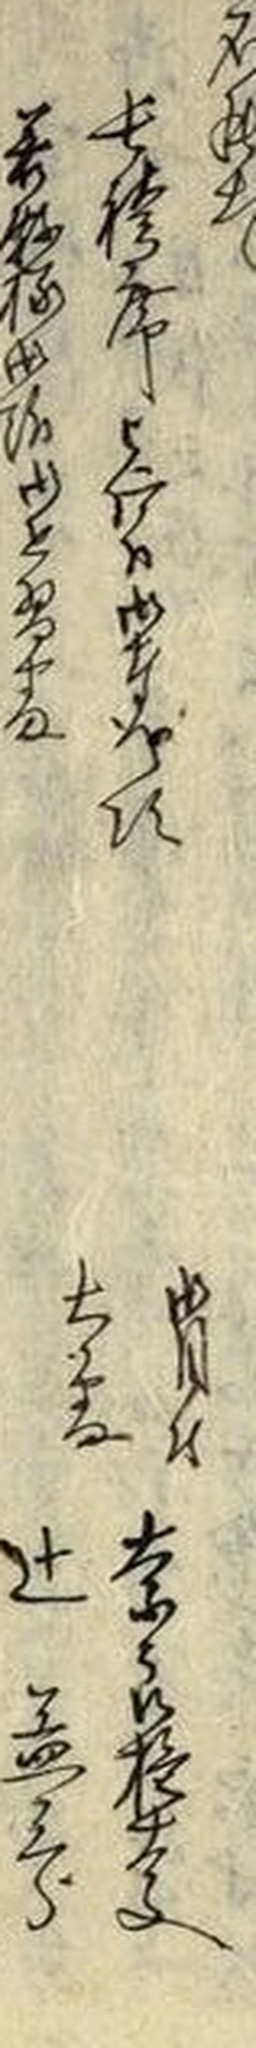若殿様御附御近習番大御番辻益三郎
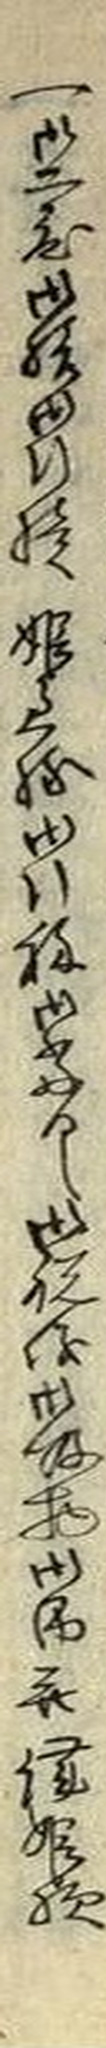一御二度御膳御引続姫君様御引移御当日之御祝儀御吸物御酒并謹姫様
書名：少傅日録抄（斉承付側向頭取日記、在国）
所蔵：福井県文書館 Fukui Prefectural Archives
